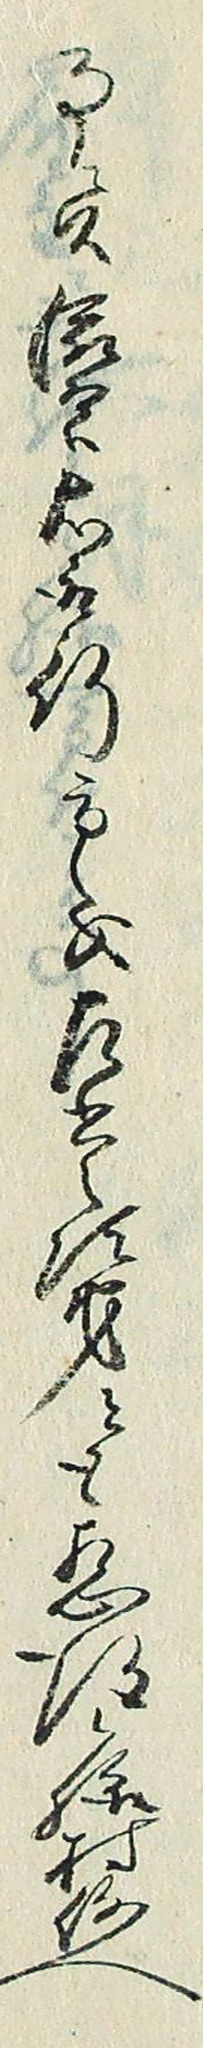事ニ候依而ハ右取行方之義左書之次第をも相心得候様村役人
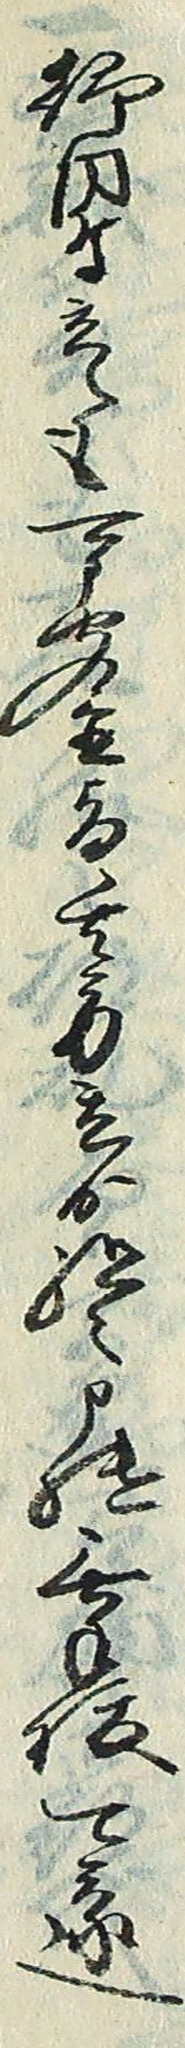郷目付共へも可申聞置旨其方共ゟ組々申継無手抜可遂
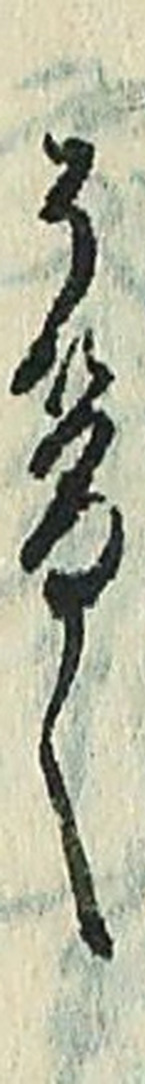了簡候
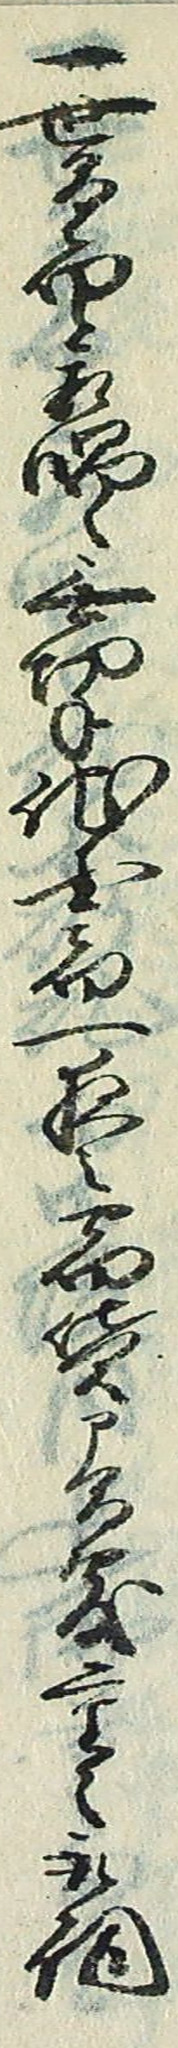一世間者と相唱候無切手他国者一夜之宿貸申間敷重々取調
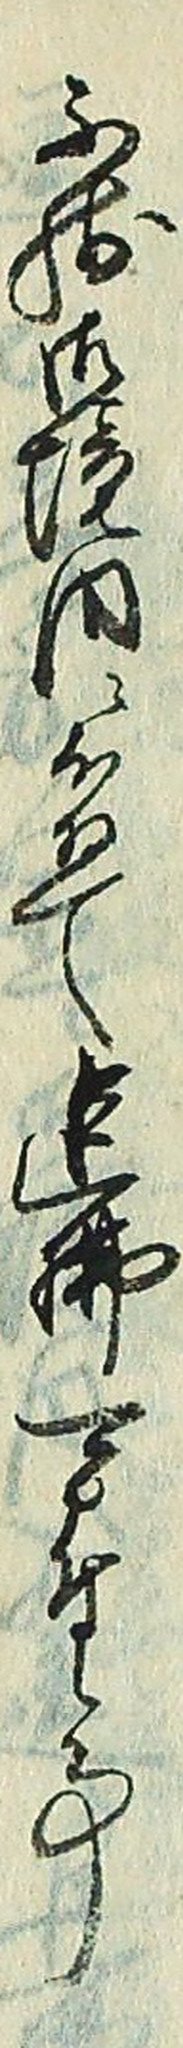不残御境目ニおゐて追拂可申付候事
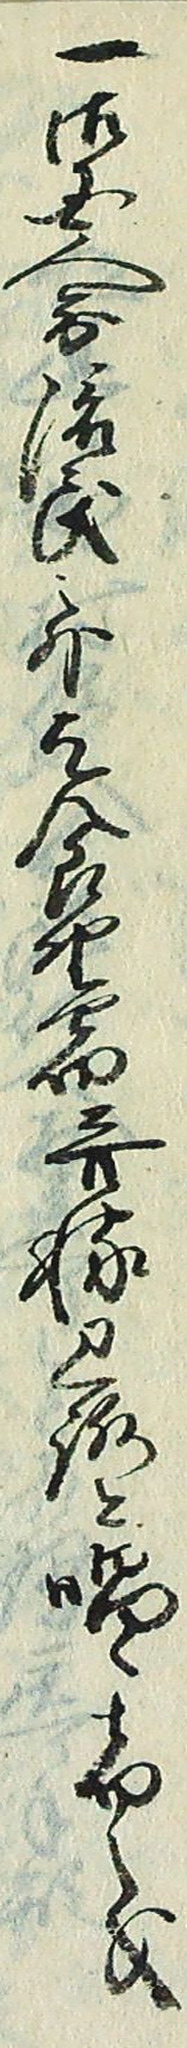一御国人別流民之外乞食野宿幷稼辺路と唱候者之義
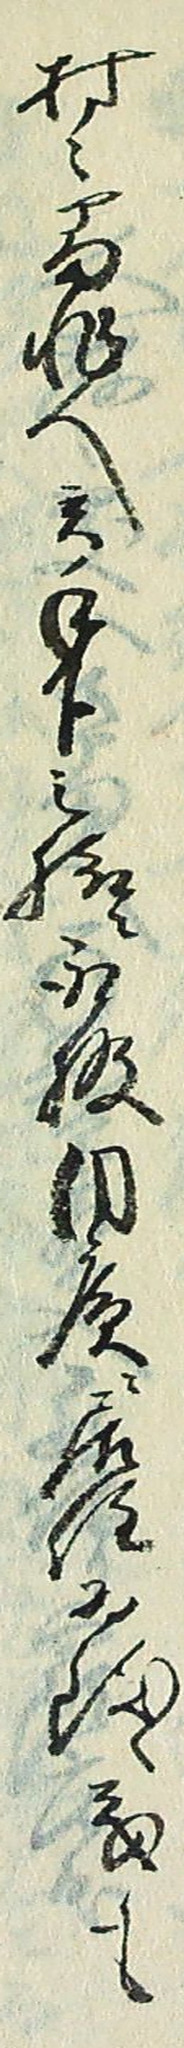村々番非人共手下之様ニ取扱目廣ニ居住為致候義も
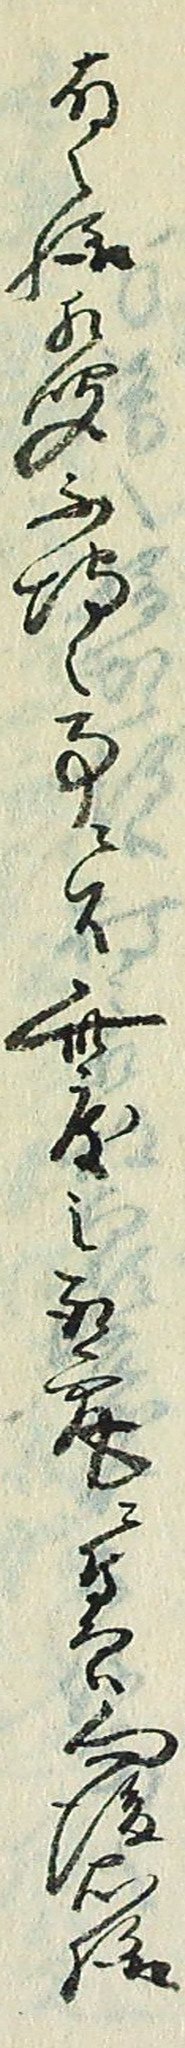有之様相聞不埒之事ニ候此度之取究ニ付而ハ向後右様
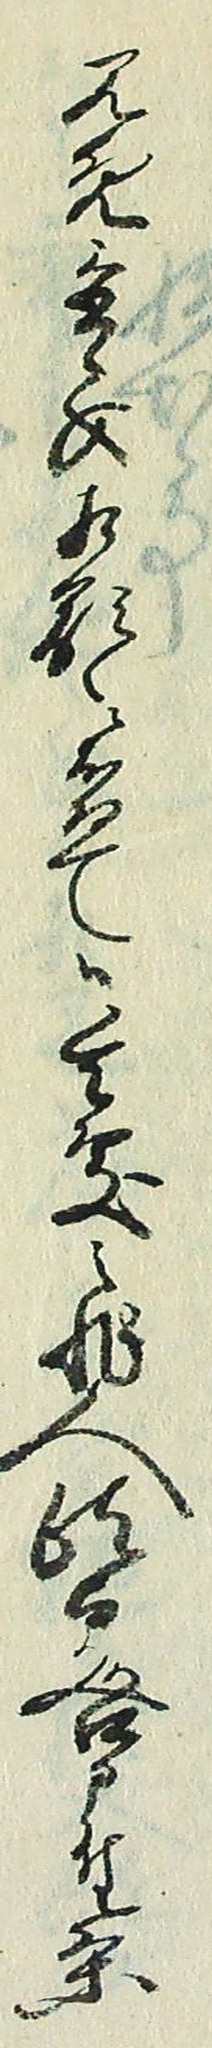見免置候義相顕候ニおゐてハ其處之非人屹と咎申付候条
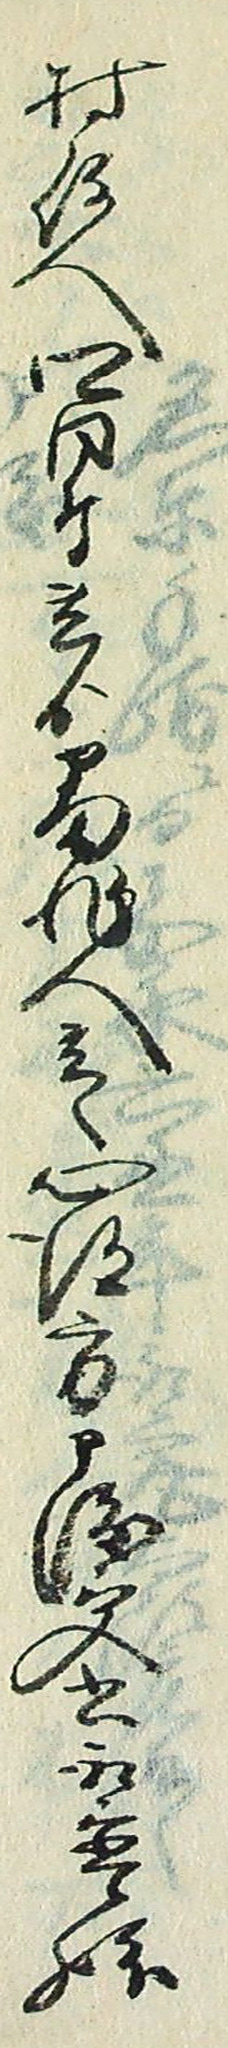村役人郷目付共ゟ番非人共へ心得方申渡受書取置候様
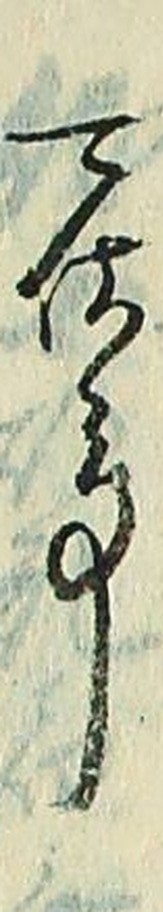可仕事
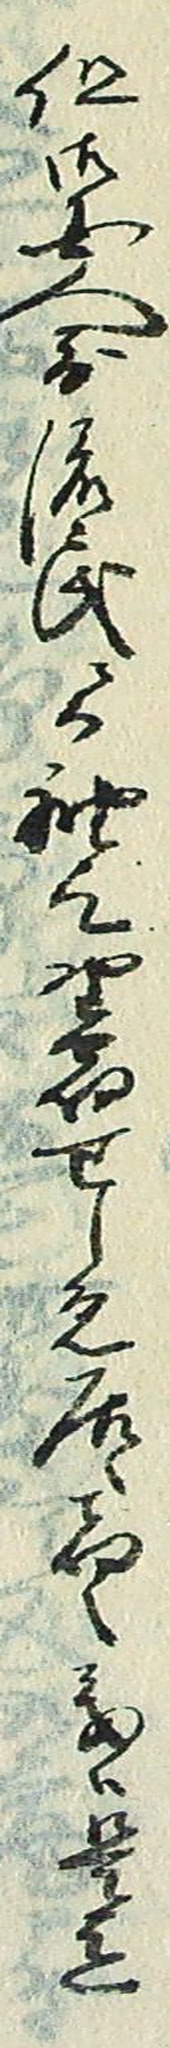但御国人別流民ニ而袖乞野宿せしめ居候者之義ハ是迄
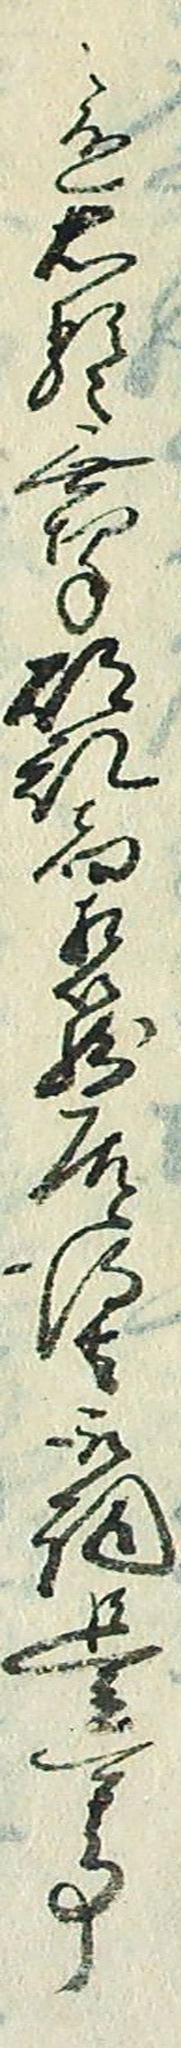之通右類之無切手胡乱者相籠居候得者取調追立可申事
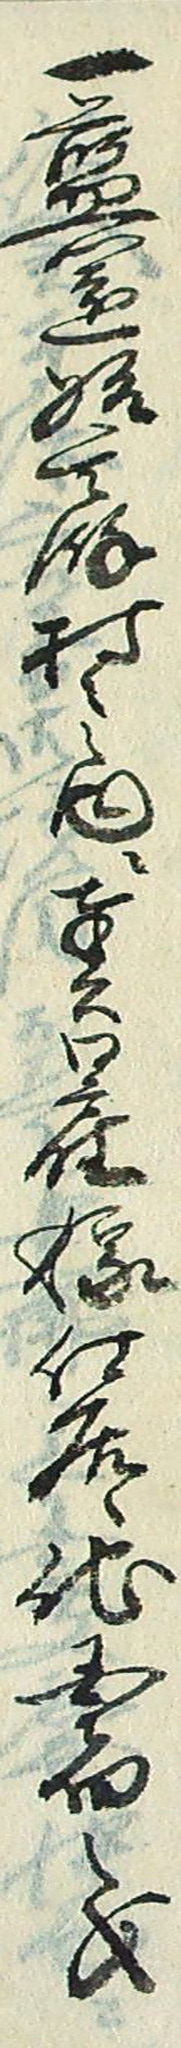一藍園始其餘村々之内ニ奉公日雇稼仕居候他国者之義

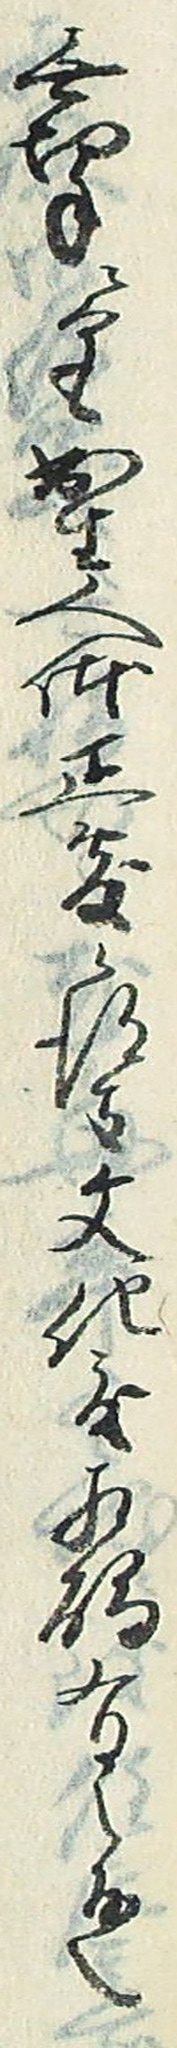無切手ニ而も出生人体正敷候得者文化度相觸有之通
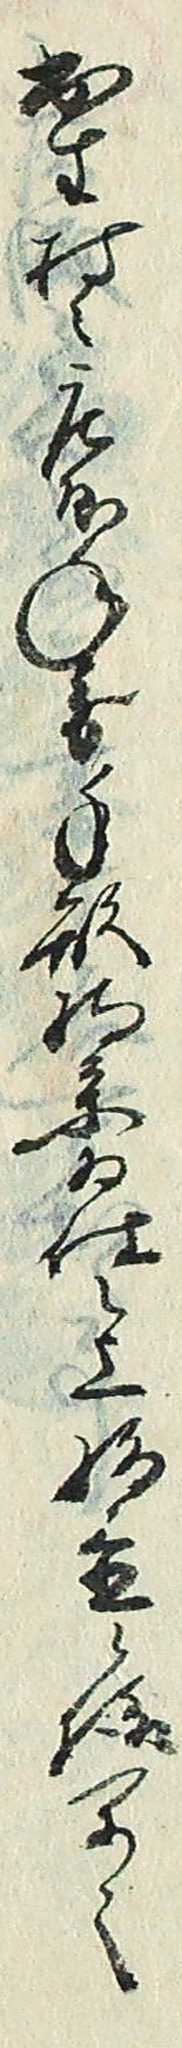出生村之庄屋年寄手形持参為仕之上指置候様早々
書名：諸御趣意書并御下知向之写
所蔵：鳴門教育大学 Naruto University of Education
